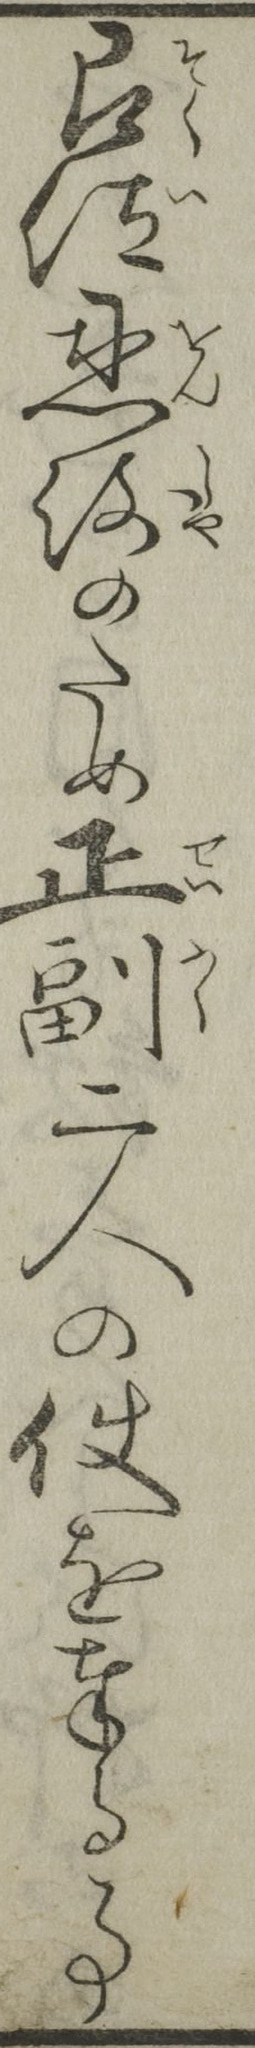即位恩謝のため正副二人の仗を奉る事
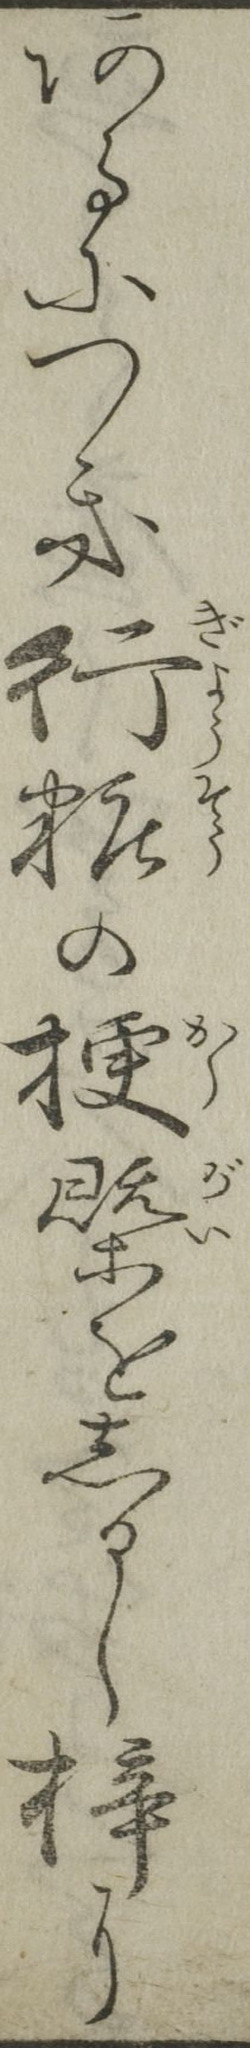あるにつき行粧の梗概をしるし梓に

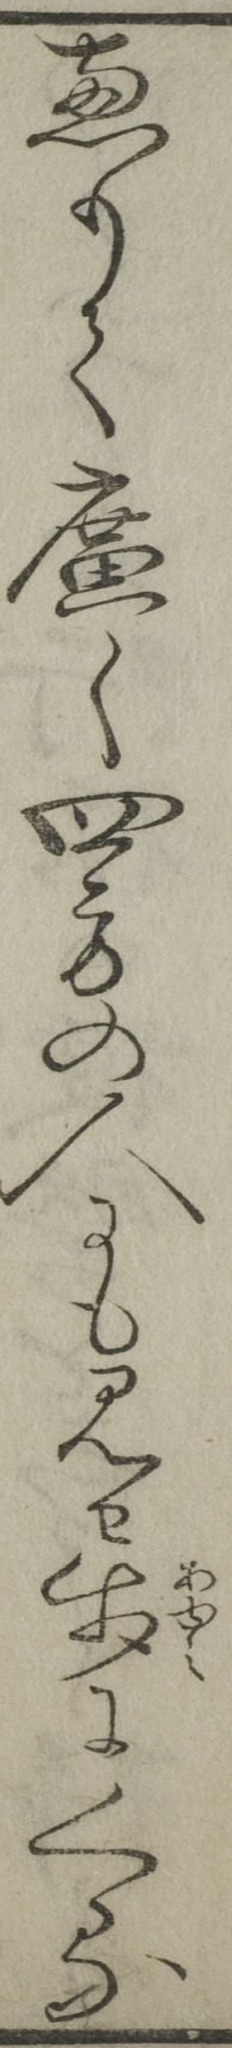ゑりて廣く四方の人にも見せ歩にくる
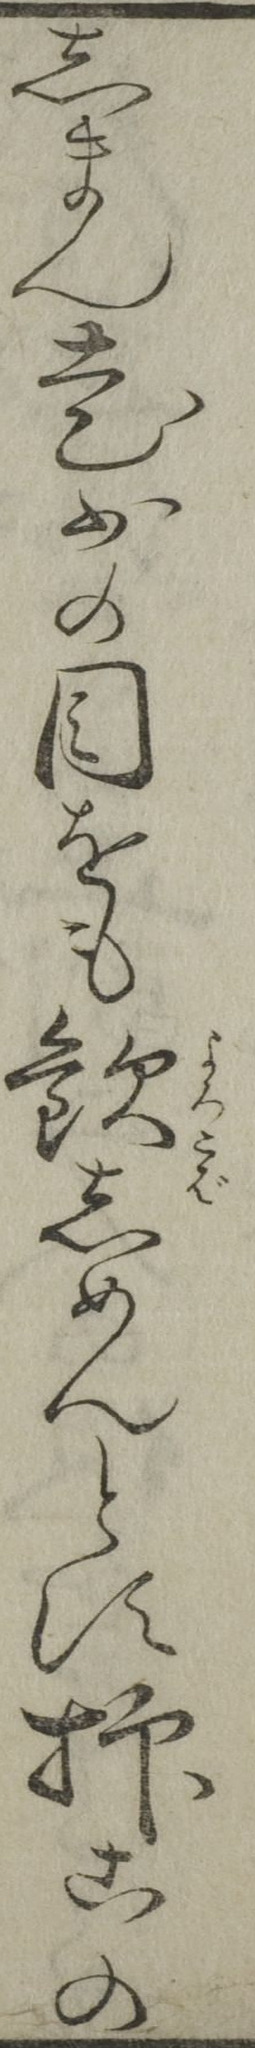しまん老少の目をも歓しめんとす抑この
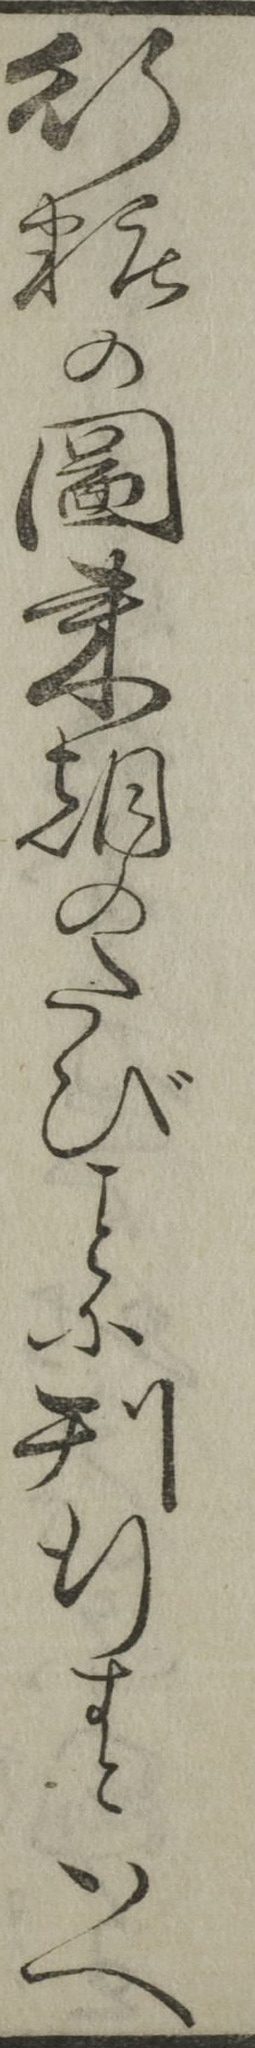行粧の圖来朝のたびことに刊行すといへ
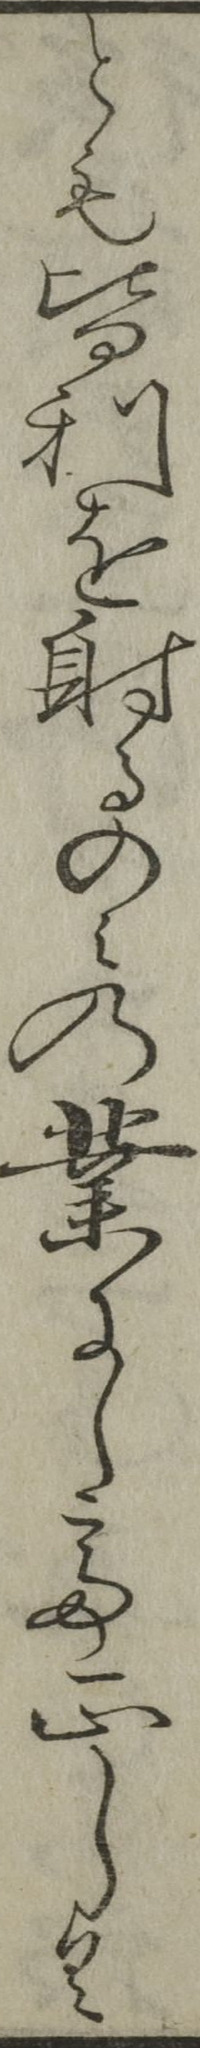とも皆利を射るのみの業にして正しく
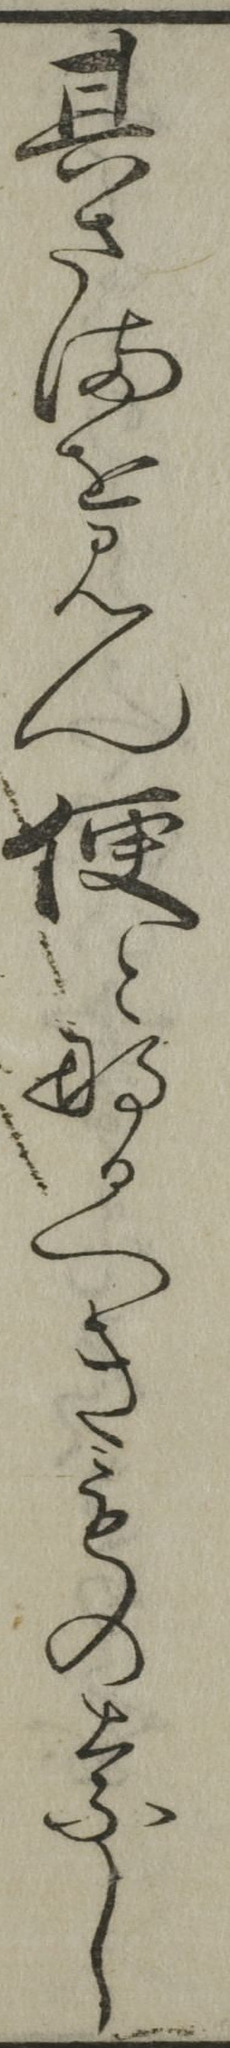其さまを見ん便となるへきものなく
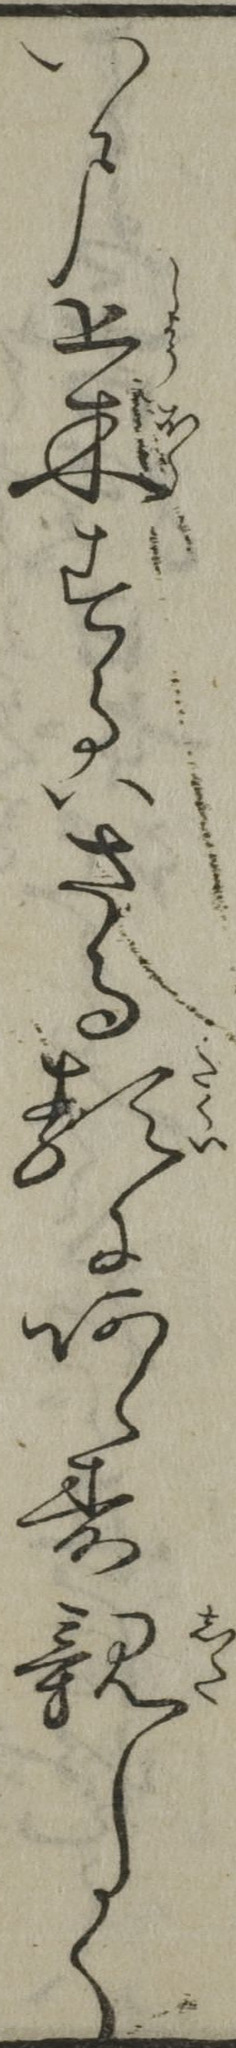いま上木するはさる類にあらす親しく
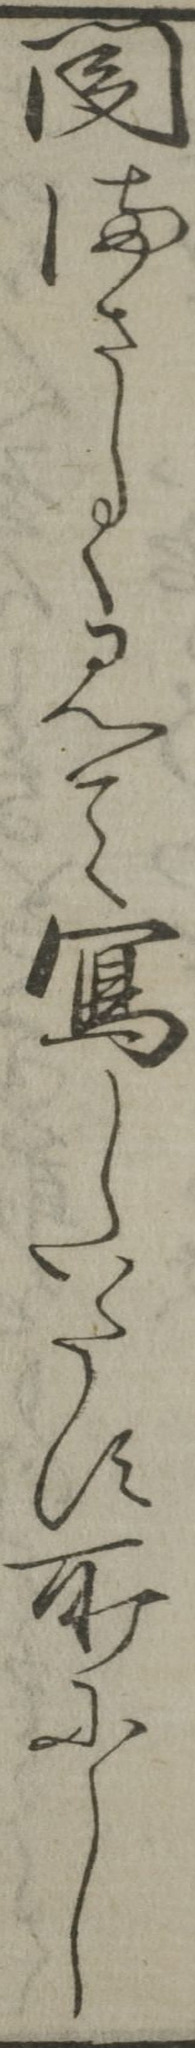聞まさしく見て寫しいたす所にし
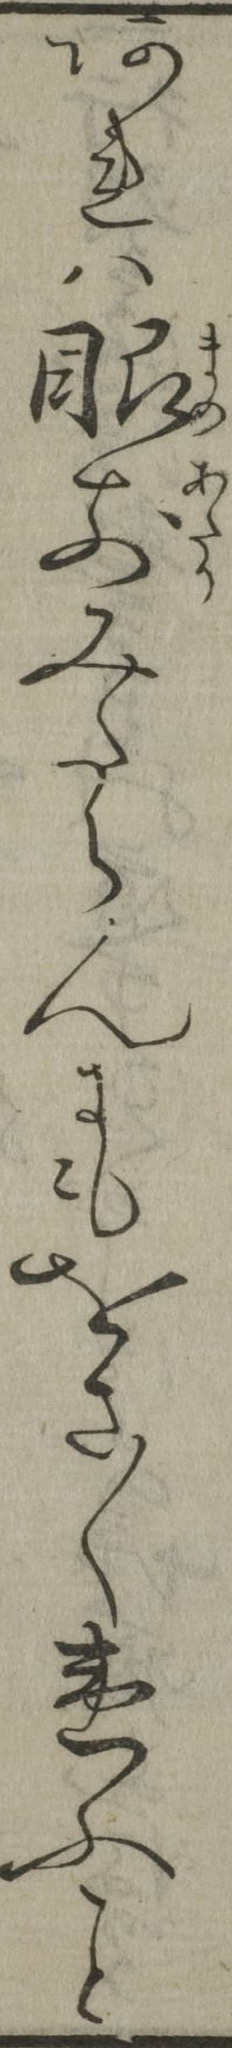あれは眼前みたらんにもをさ〳〵違ふこと
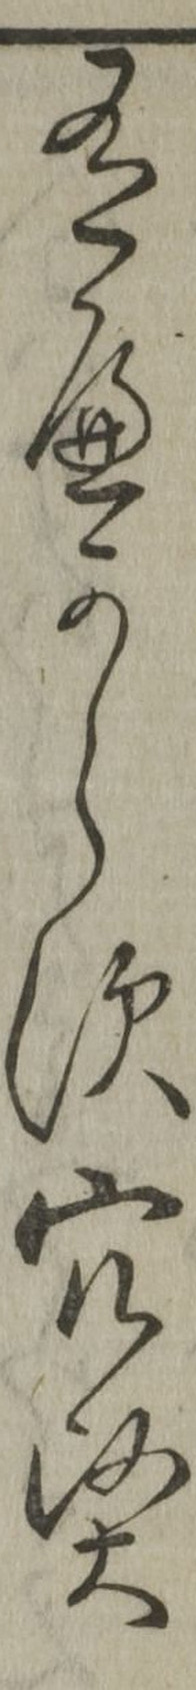有へからす穴賢
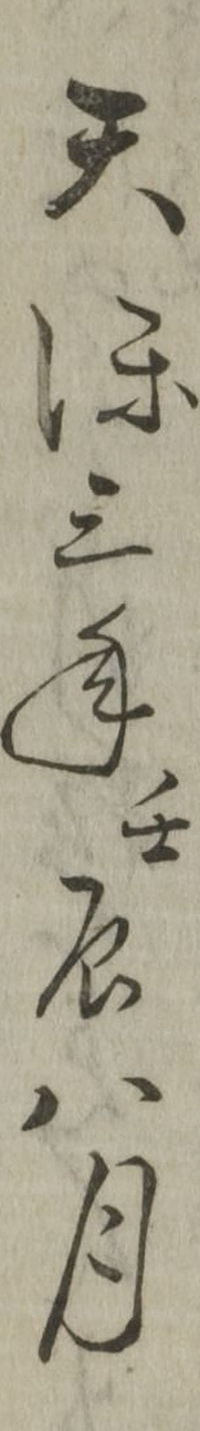天保三年壬辰八月
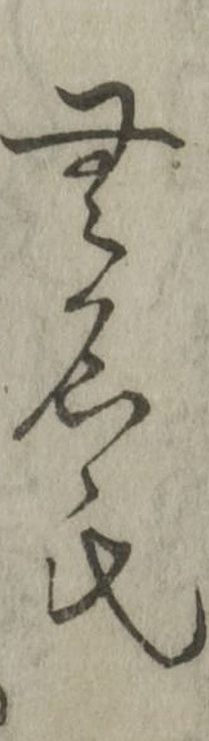無名氏
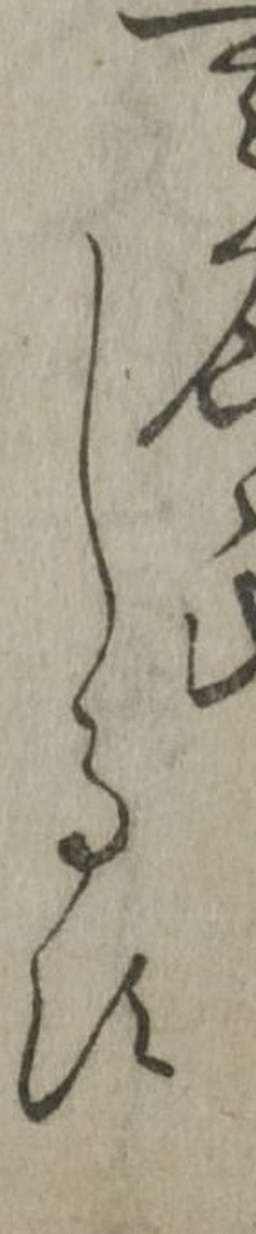しるす

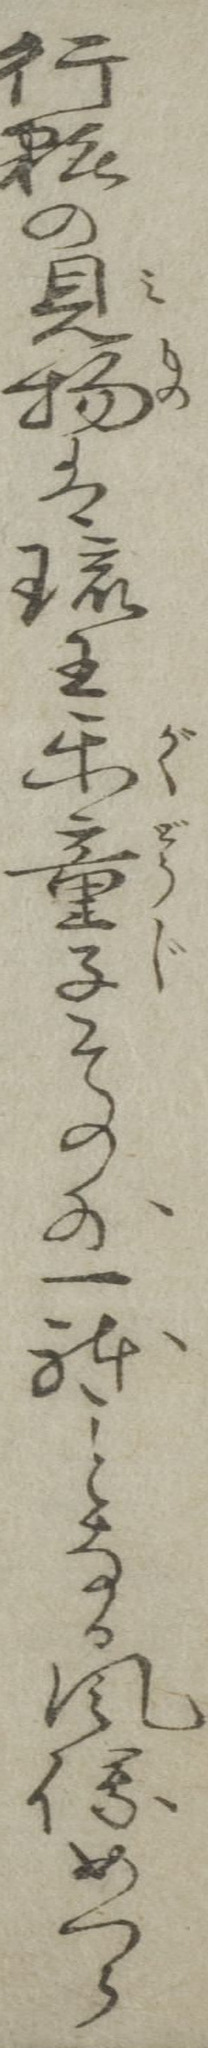一行粧の見物は琉王楽童子その外一躰ことなる風儀めつら
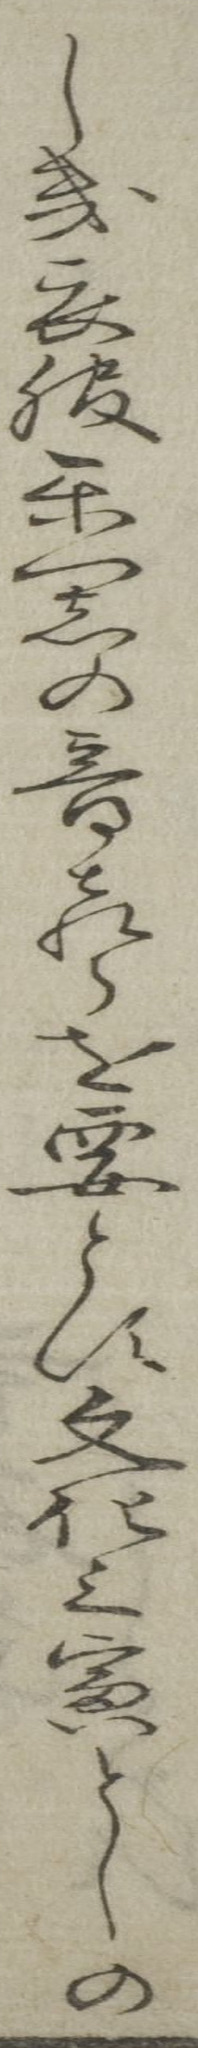しき衣服楽器の音声を要とす文化三寅としの
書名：琉球人行列記 天保3年
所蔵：University of the Ryukyus Library
